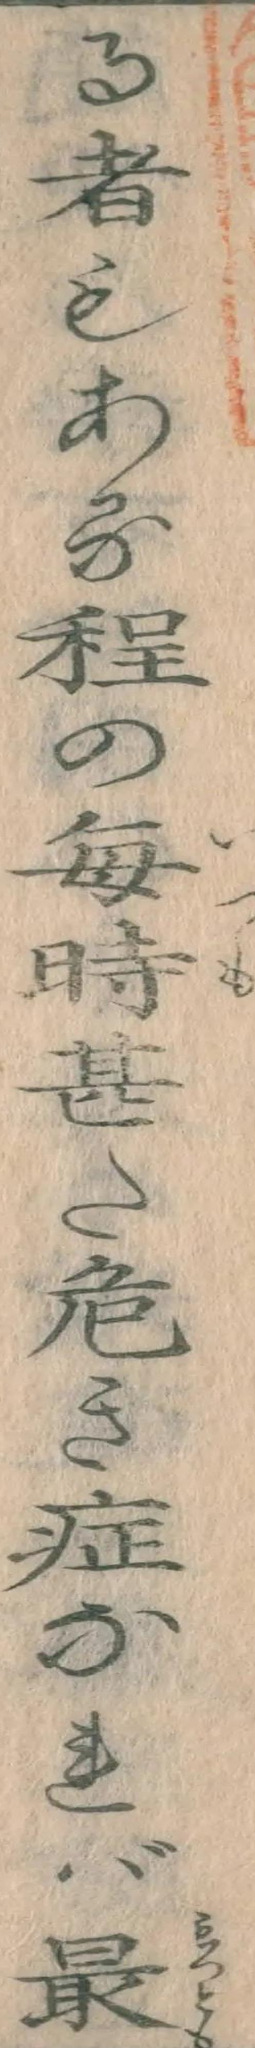る者もある程の毎時甚た危き症なれば最
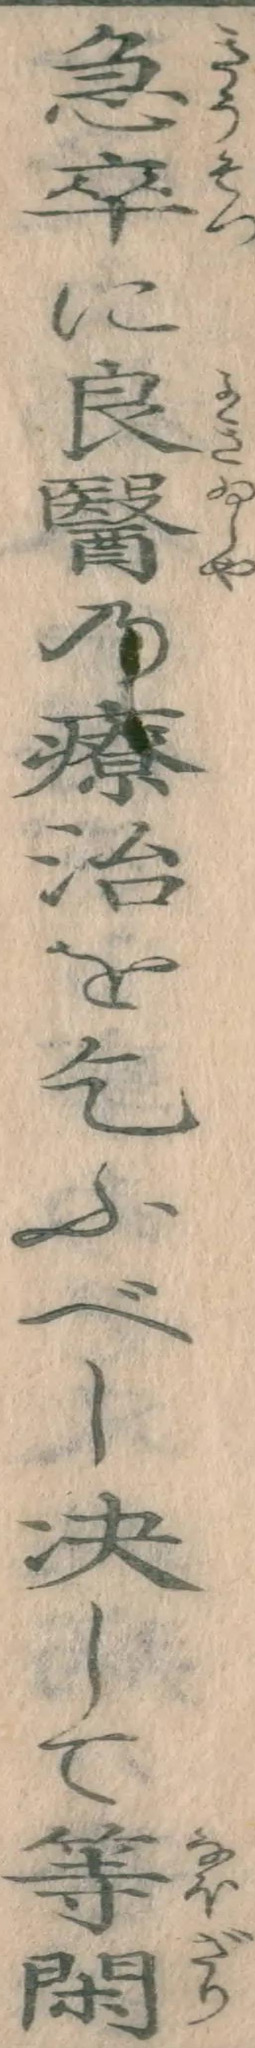急卒に良医の療治を乞ふべし決して等閑
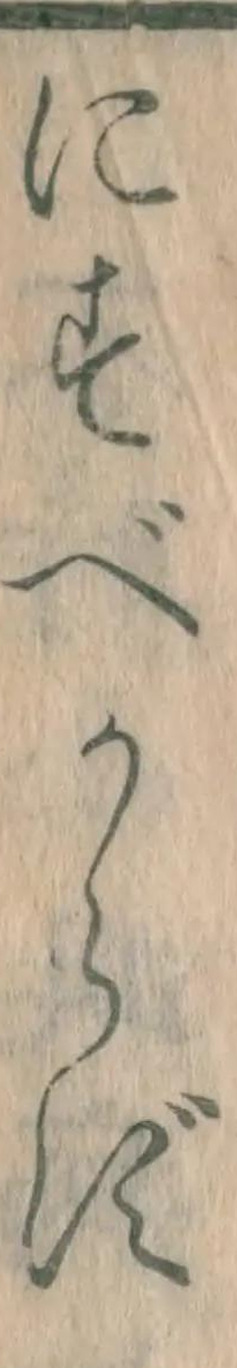にすべからず

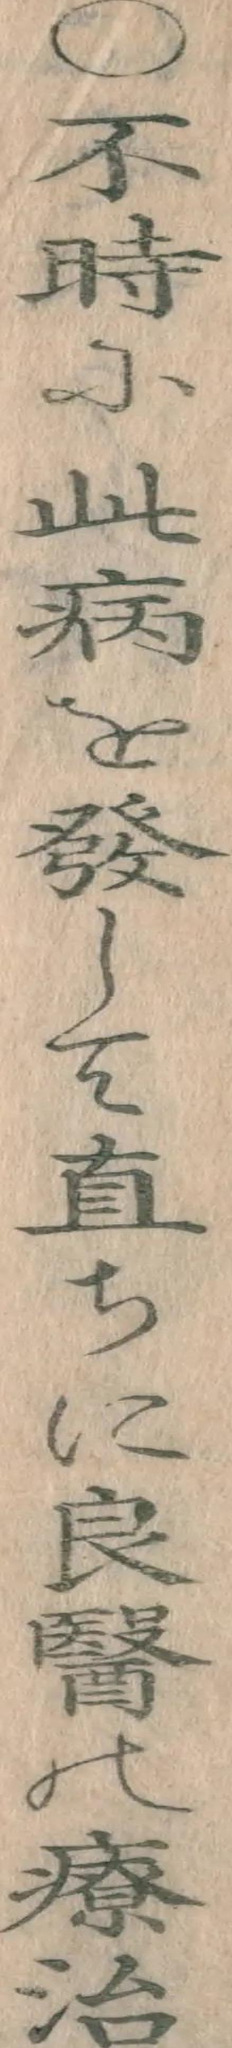〇不時に此病を発して直ちに良医の療治
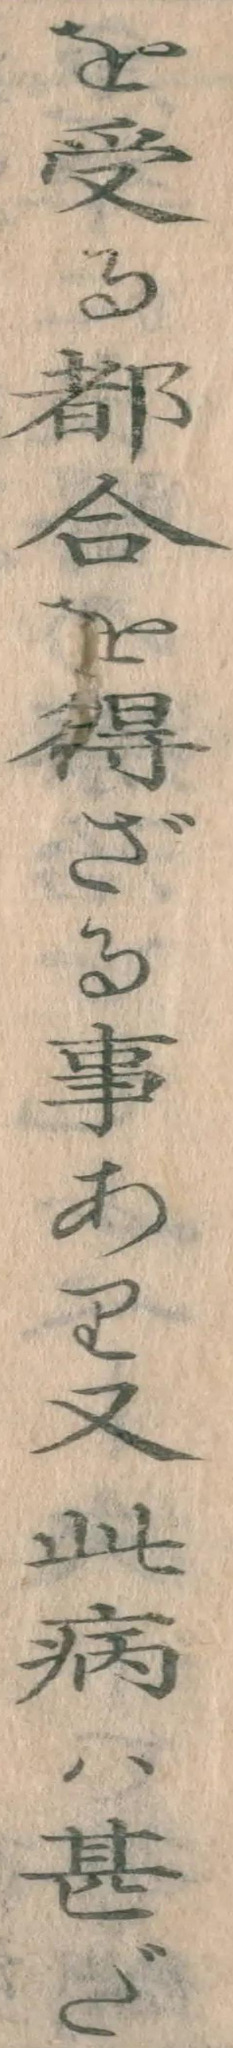を受る都合を得ざる事あり又此病は甚だ
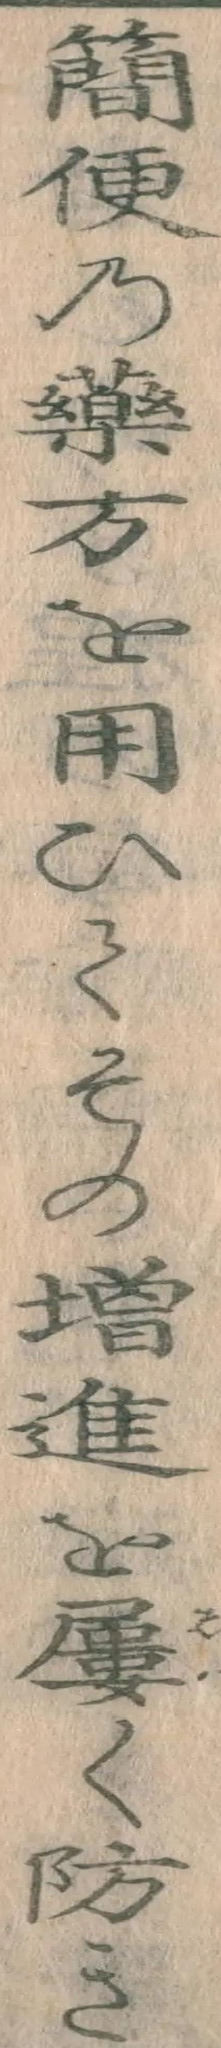簡便の薬方を用ひてその増進を屡〳〵防き
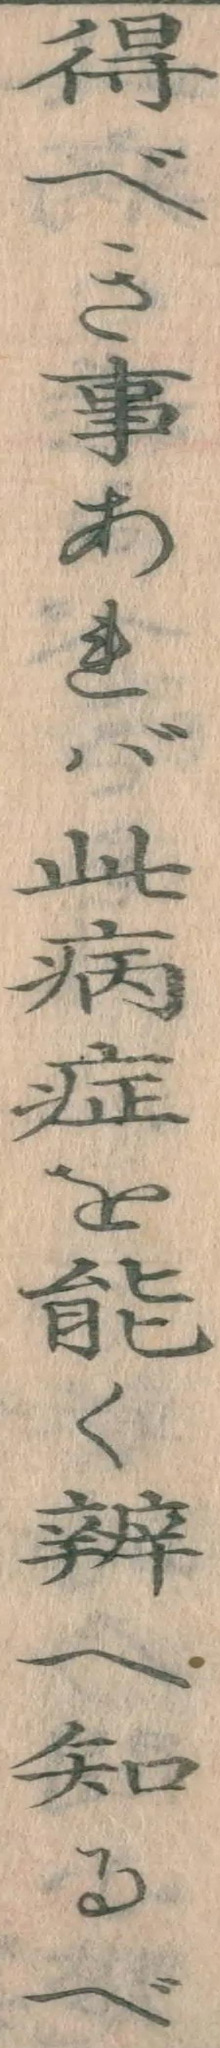得べき事あれば此病症を能く弁へ知るべ
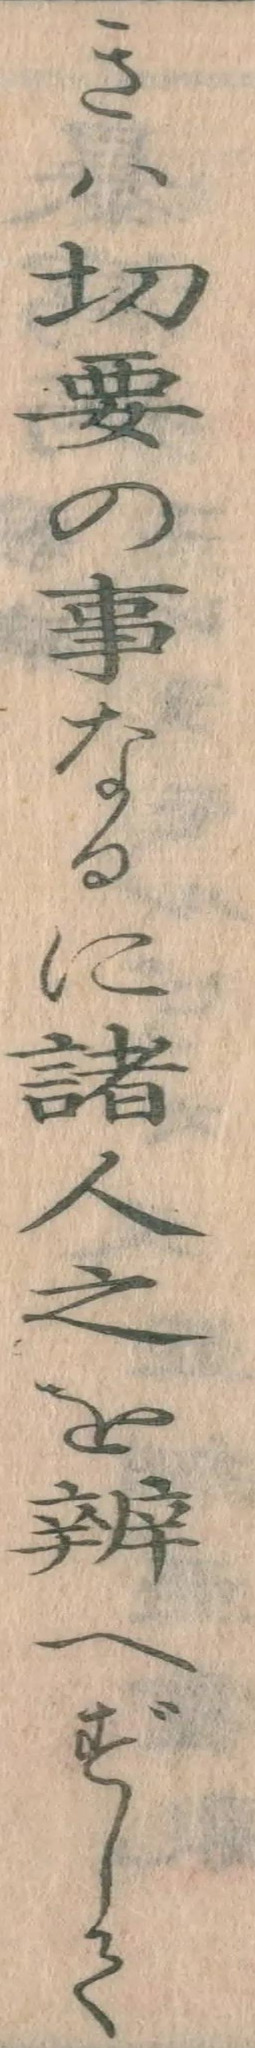きは切要の事なるに諸人之を弁へずして
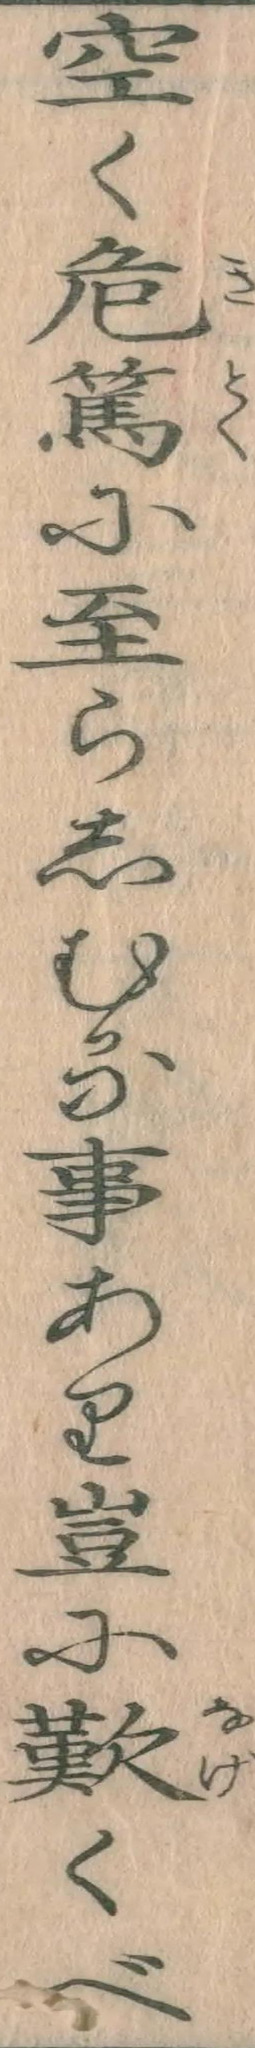空く危篤に至らしむる事あり豈に歎くべ
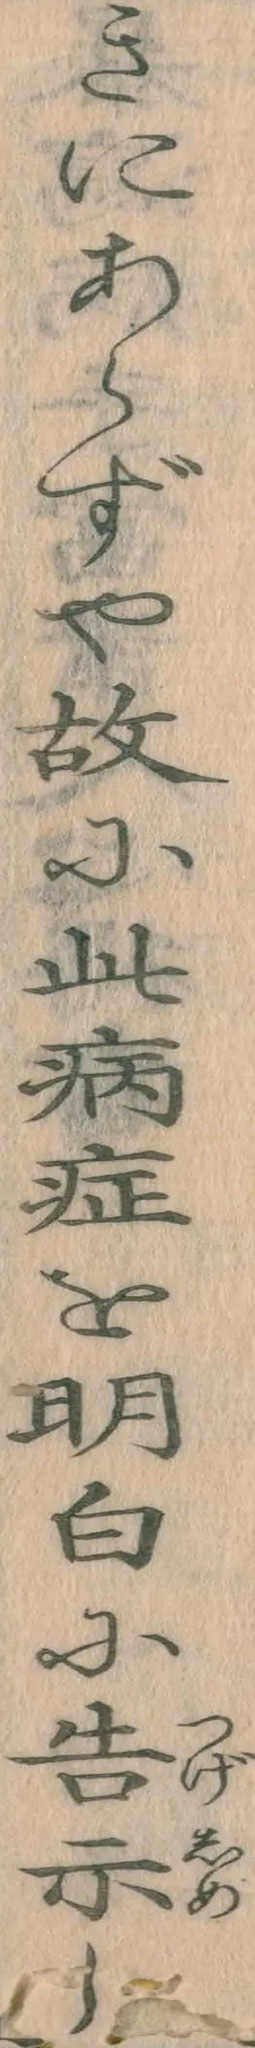きにあらずや故に此病症を明白に告示し
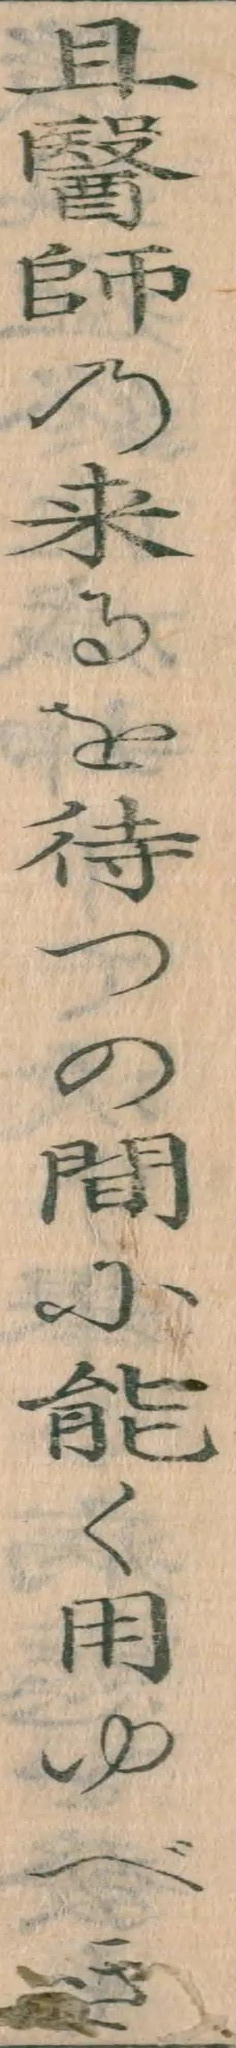且医師の来るを待つの間に能く用ゆべき
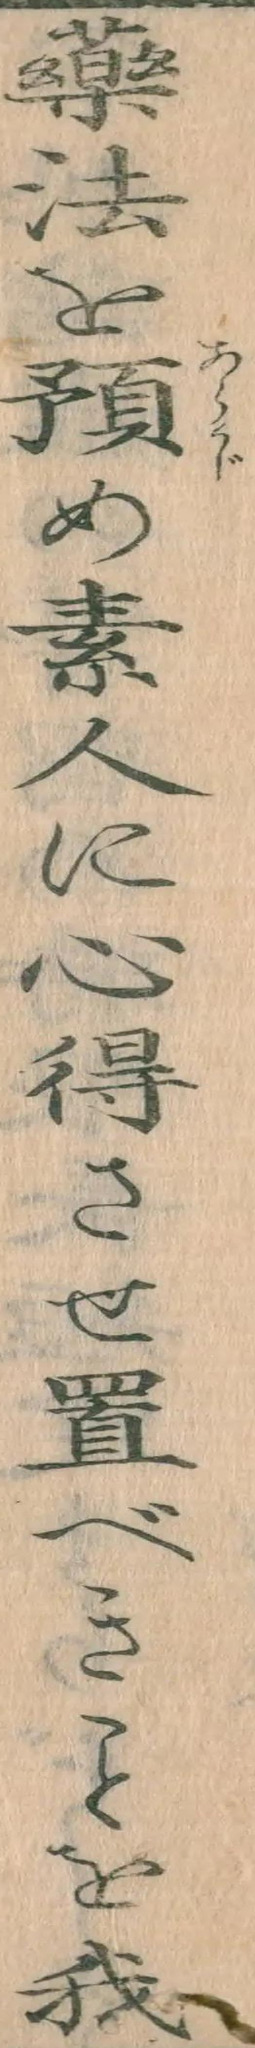薬法を預め素人に心得させ置べきことを我
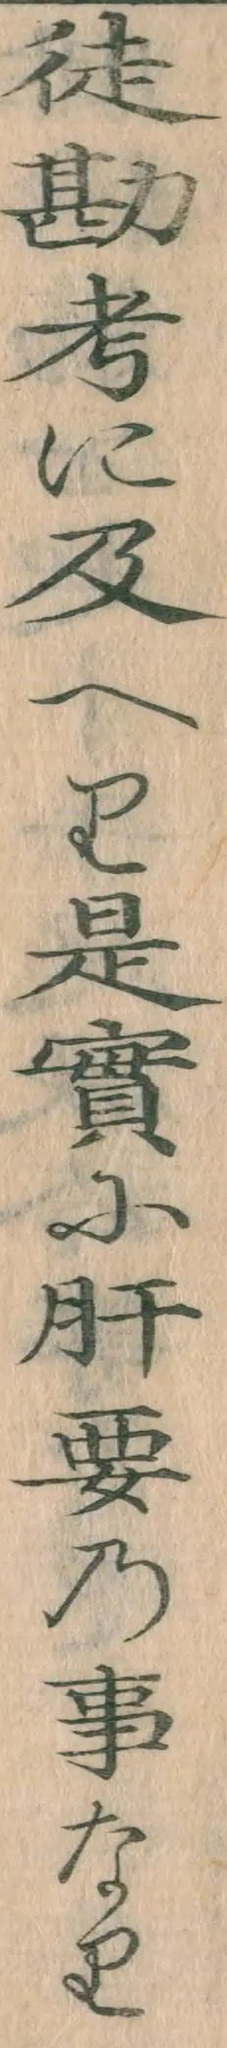徒勘考に及へり是実に肝要の事なり
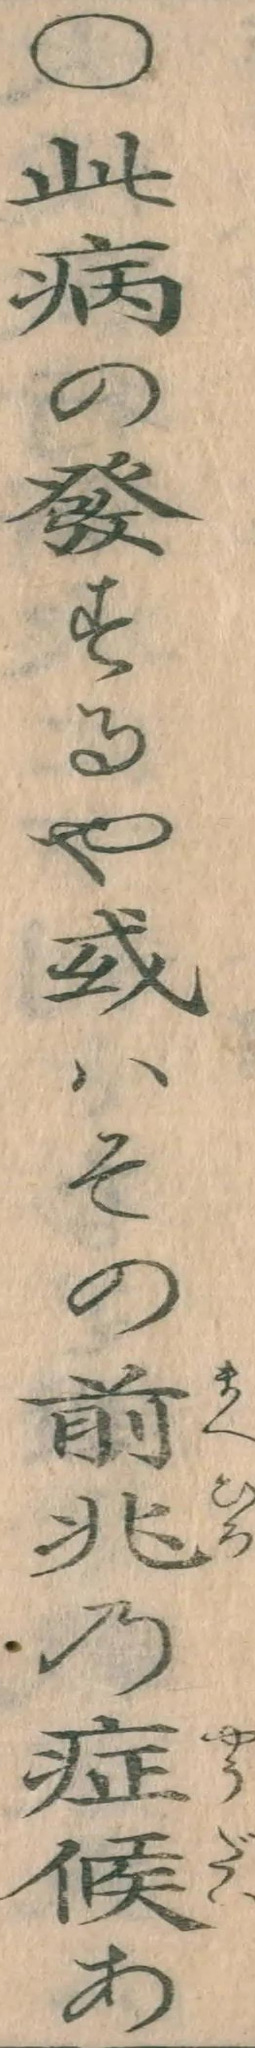〇此病の発するや或はその前兆の症候あ
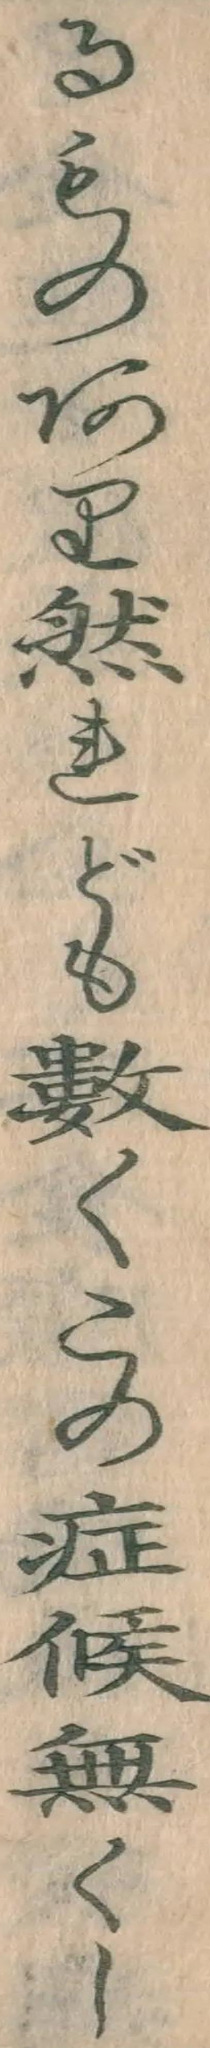るものあり然れども数〳〵この症候無くし
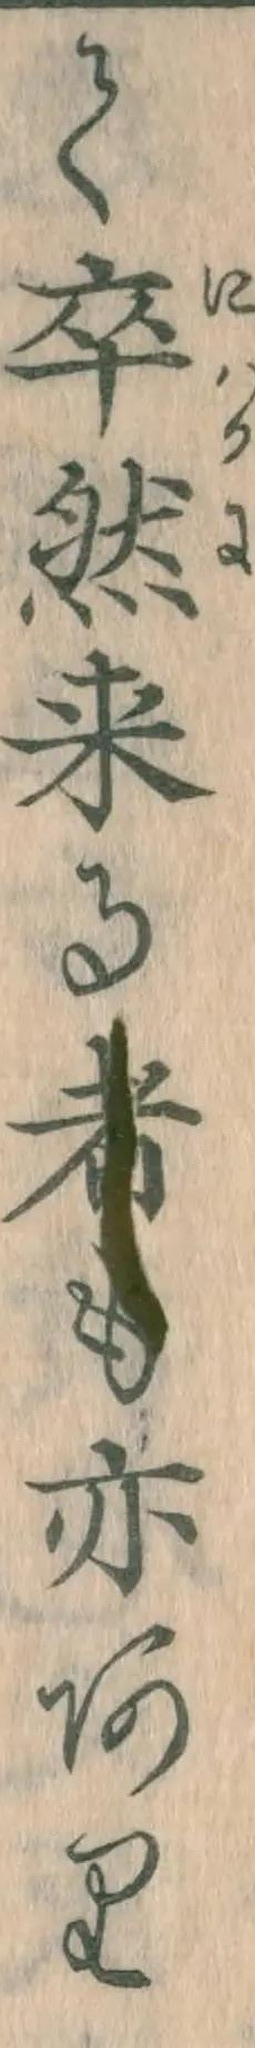て卒然来る者も亦あり
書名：暴瀉病手当素人心得書
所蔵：国立国会図書館 National Diet Library, JAPAN
